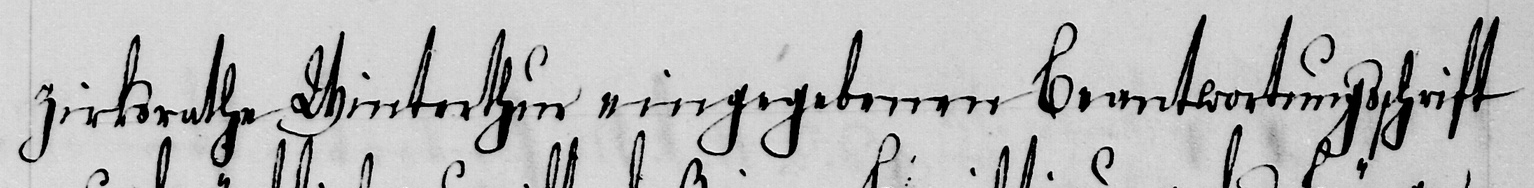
zirksrathe Winterthur eingegebenen Beantwortungsschrift
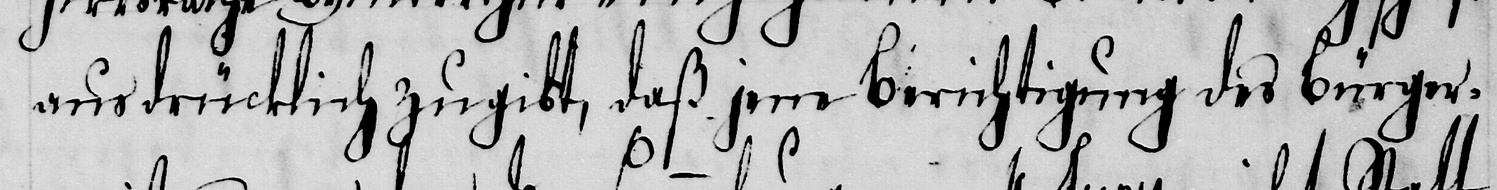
ausdrücklich zugibt, daß jene Berichtigung des Bürger¬
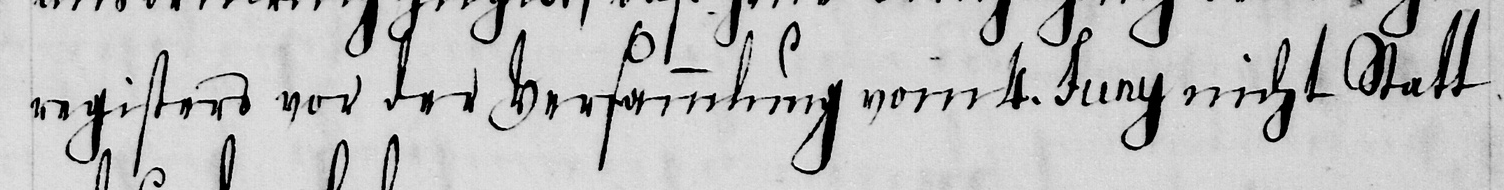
registers vor der Versammlung vom 4. Juny nicht Statt
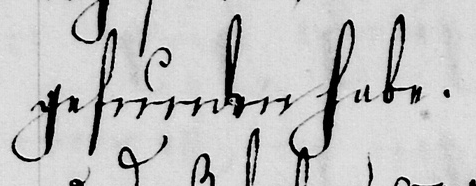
gefunden habe.
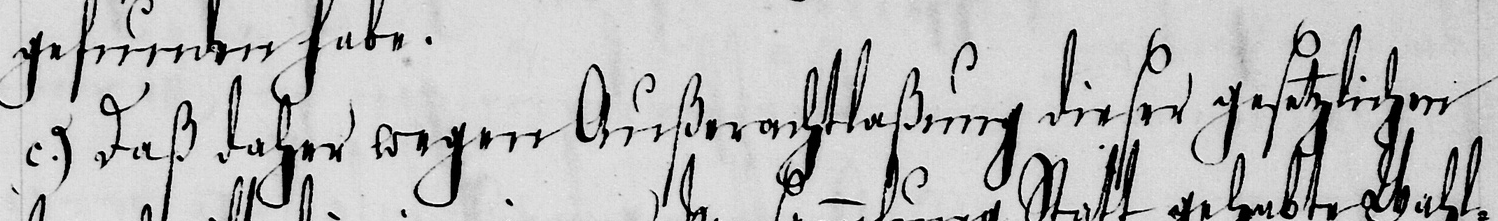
c.) Daß daher wegen Außerachtlaßung dieser gesetzlichen
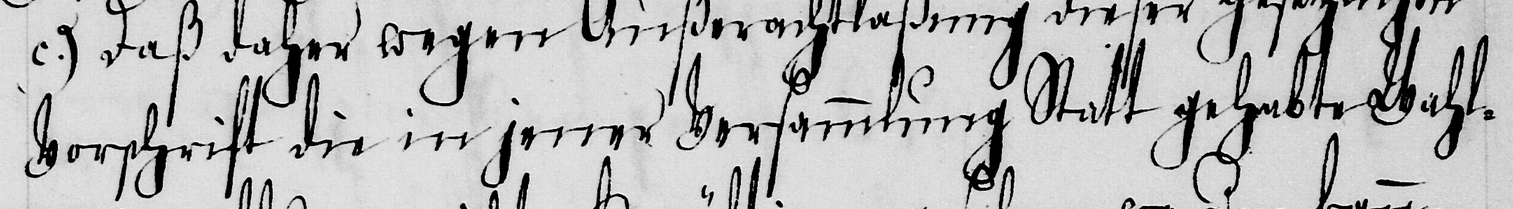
Vorschrift die in jener Versammlung Statt gehabte Wahl¬
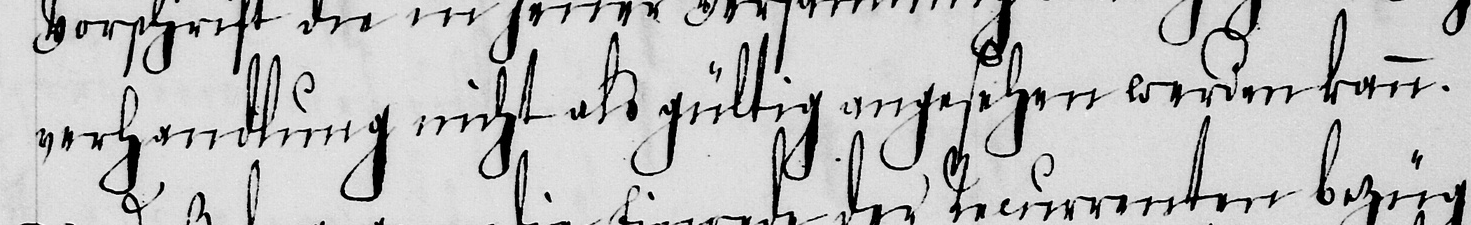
verhandlung nicht als gültig angesehen werden kann.
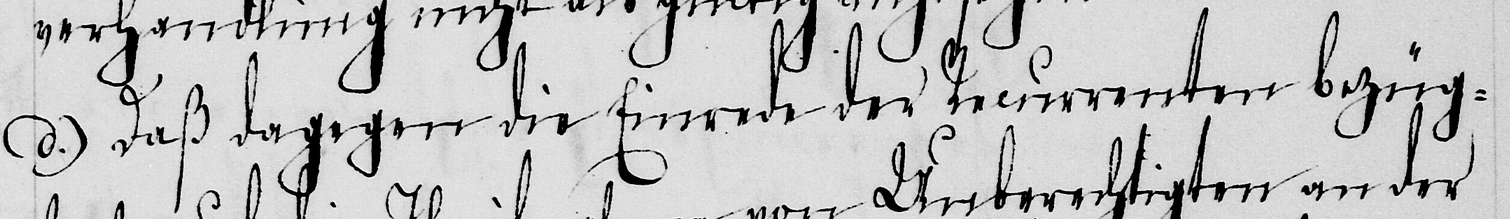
d.) Daß dagegen die Einrede der Recurrenten bezüg¬
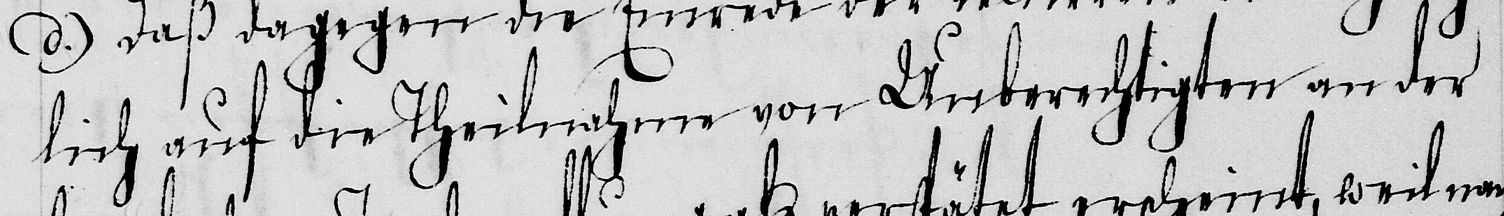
lich auf die Theilnahme von Unberechtigten an der
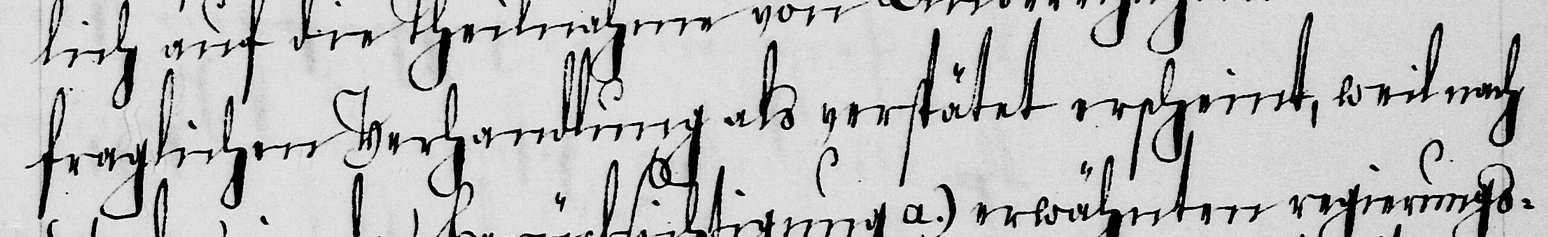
fraglichen Verhandlung als verspätet erscheint, weil nach
